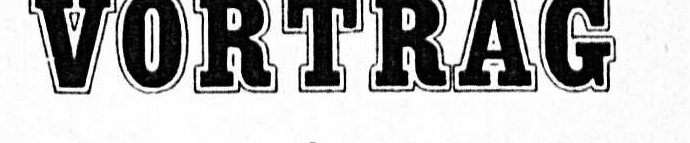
VORTRAG
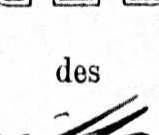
des
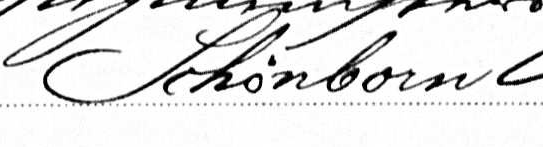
Schönborn
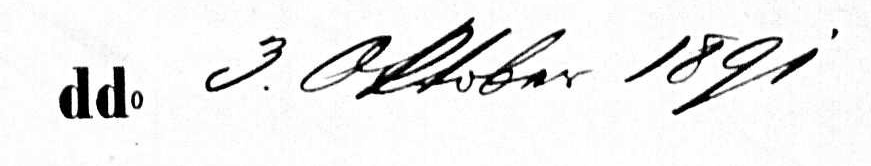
ddo 3. Oktober 1891
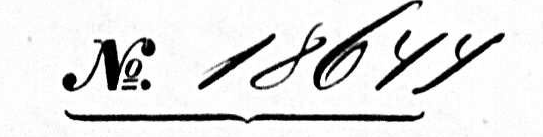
No. 17922
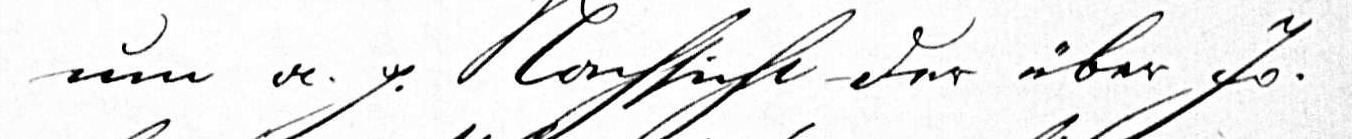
um a.g. Nachsicht der über Jo¬
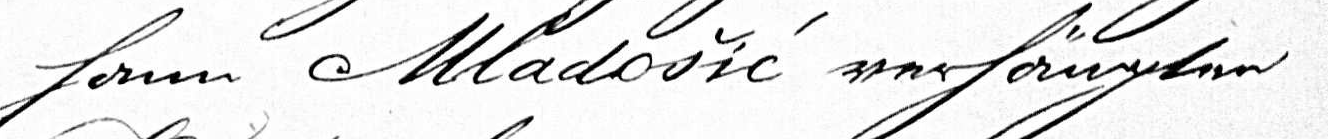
hann Mladošić verhängten
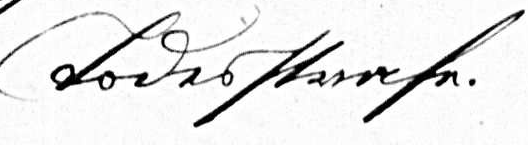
Todesstrafe.
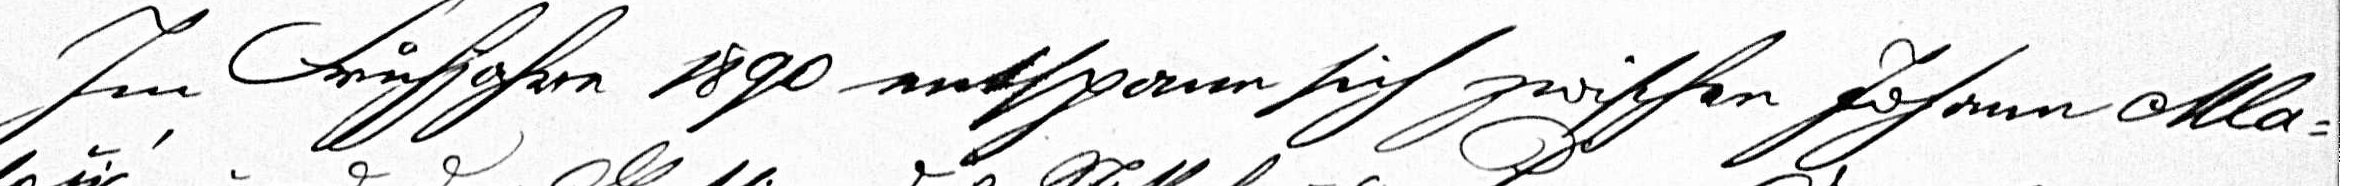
Im Frühjar 1890 entspann sich zwischen Johann Mla¬
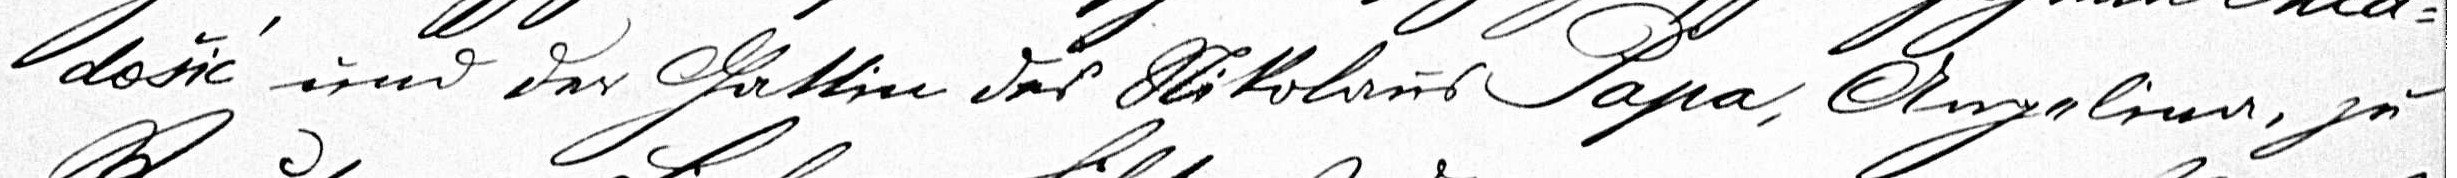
došić und der Gattin des Nikolaus Papa, Angelina, zu
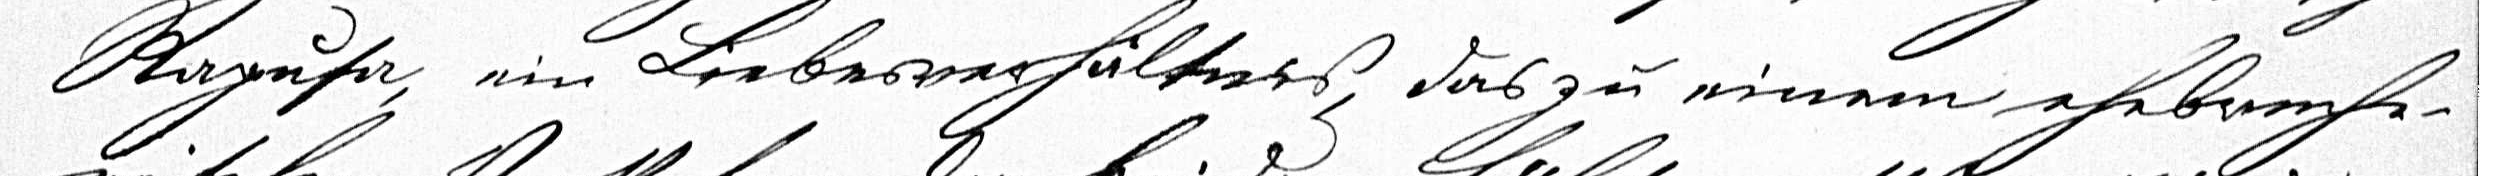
Ragusa, ein Liebesverhältnis, das zu einem ehebreche¬
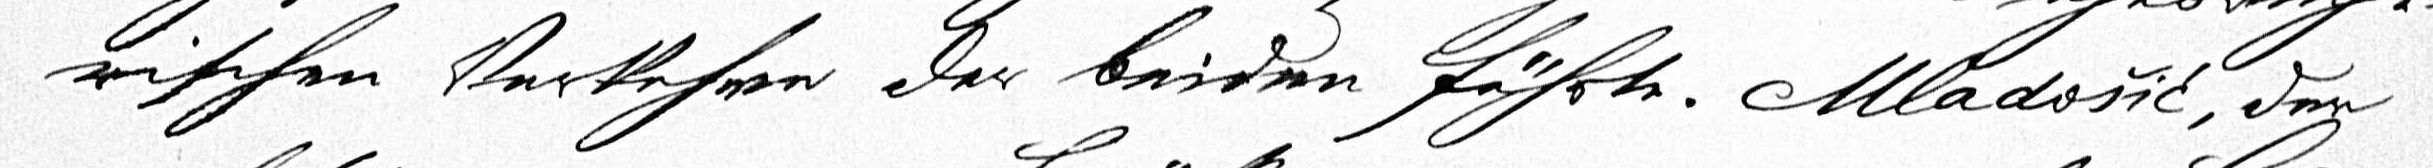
rischen Verkehre der beiden führte. Mladošić, der
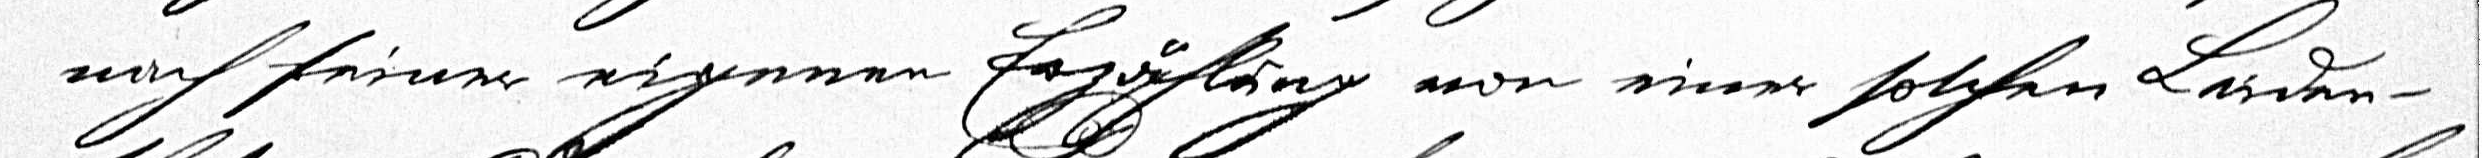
Nach seiner eigenen Erzählung von einer solchen Leiden¬
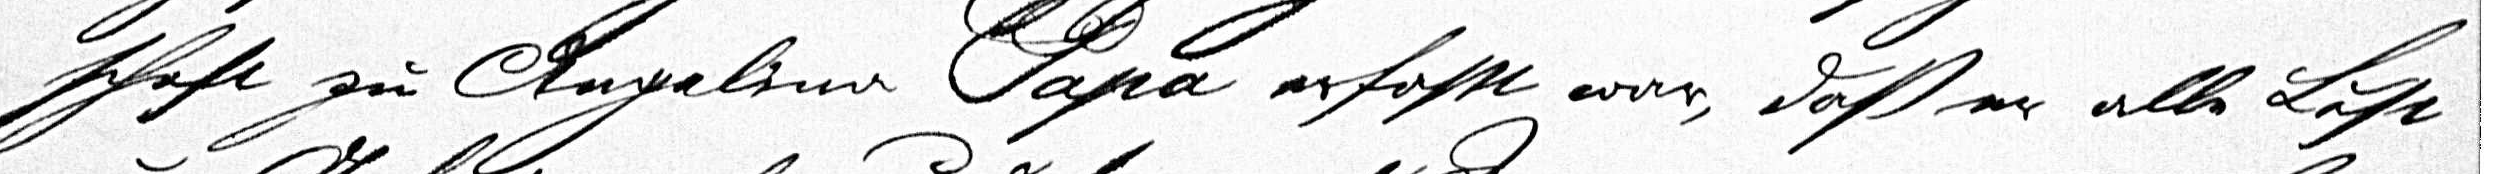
schaft zu Angelina Papa erfaßt war, aß er alle Lust
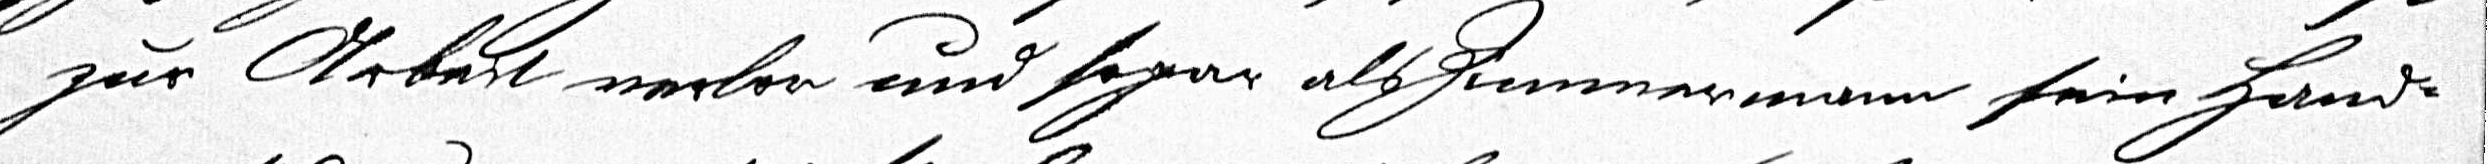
zur Arbeit verlor und sogar als Zimmermann sein Hand¬
